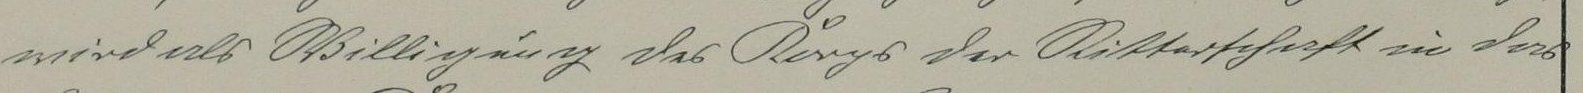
wird als Willigung des Korps der Ritterschaft in das
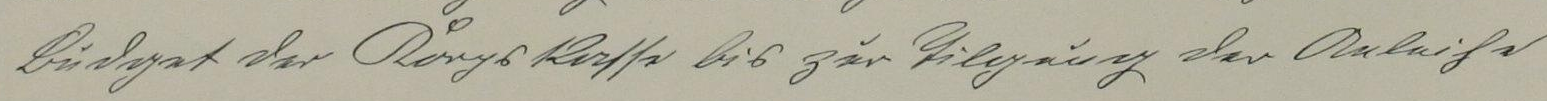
Budget der Korpskasse bis zur Tilgung der Anleihe
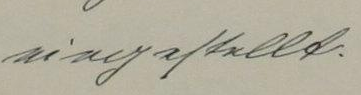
eingestellt.
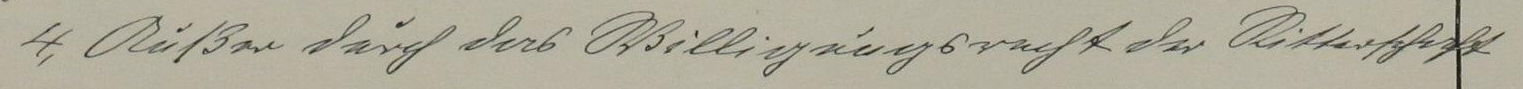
4. Außer durch das Willigungsrecht der Ritterschaft
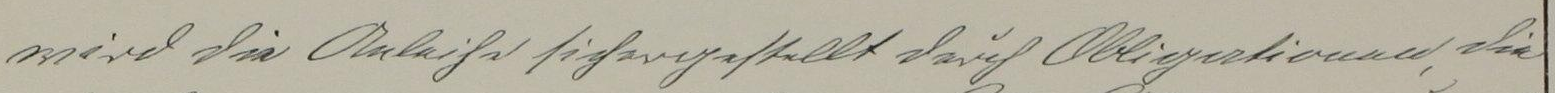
wird die Anleihe sichergestellt durch Obligationen, die
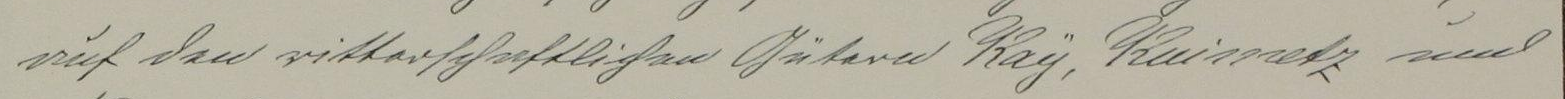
auf den ritterschaftlichen Gütern Kay, Kuimetz und
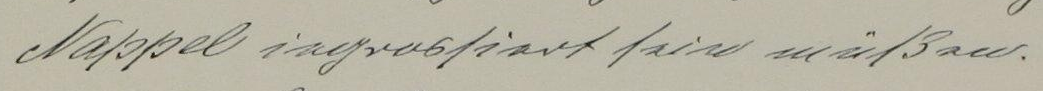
Nappel ingrossiert sein müßen.
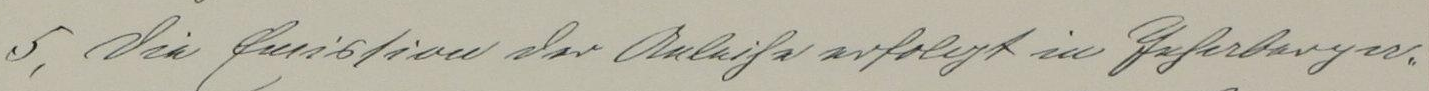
5. Die Emission der Anleihe erfolgt in Inhaberpa-
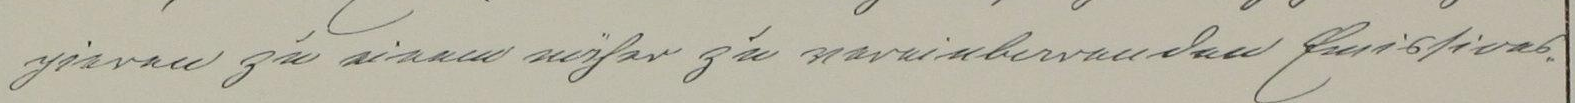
pieren zu einem näher zu vereinbarenden Emissions-
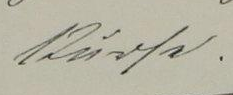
kurse.
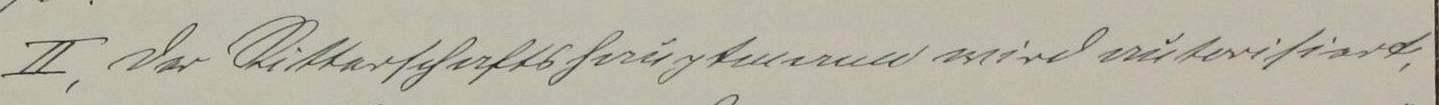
II. Der Ritterschaftshauptmann wird autorisiert,
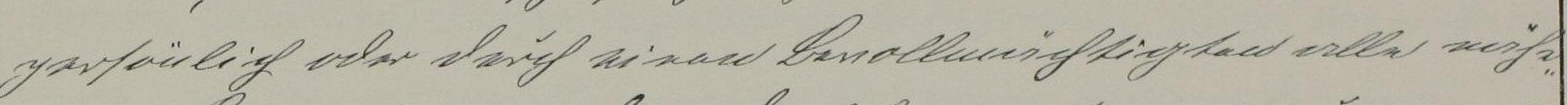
persönlich oder durch einen Bevollmächtigten alle nähe-
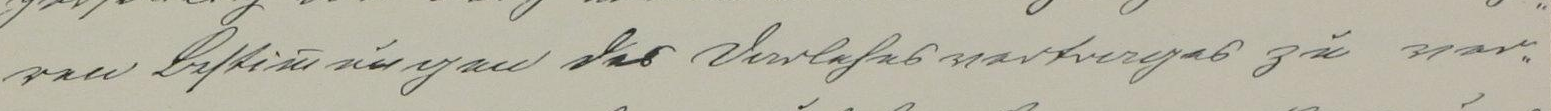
ren Bestimmungen des Darlehnsvertrages zu ver-
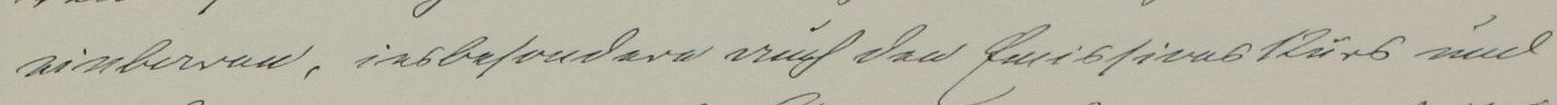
einbaren, insbesondere auch den Emissionskurs und
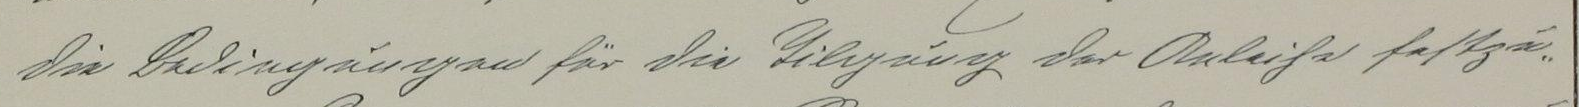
die Bedingungen für die Tilgung der Anleihe festzu-
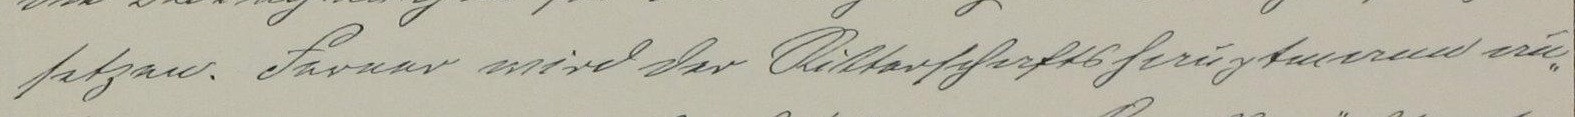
setzen. Ferner wird der Ritterschaftshauptmann au-
